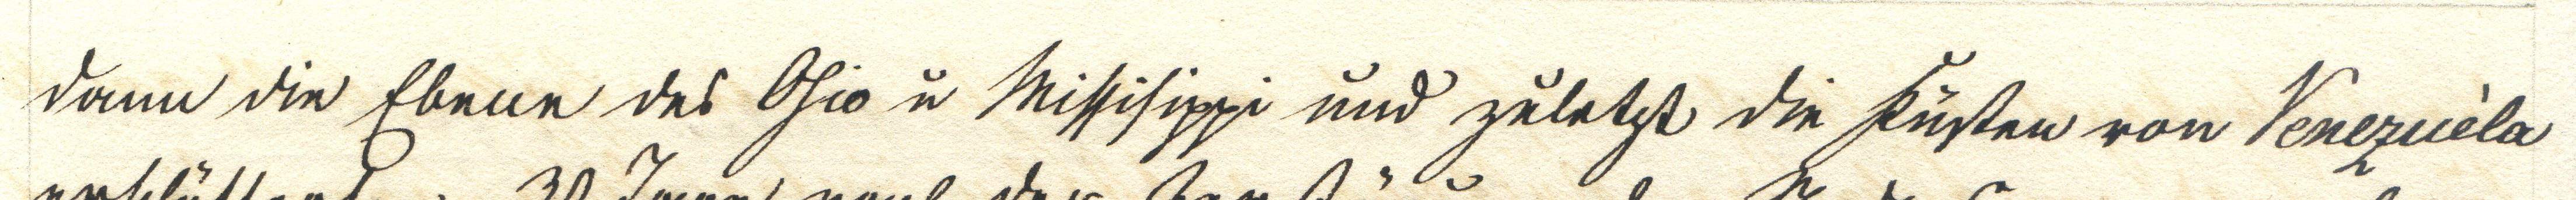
dann die Ebene des Ohio u Missisippi und zuletzt die Küsten von Venezuèla
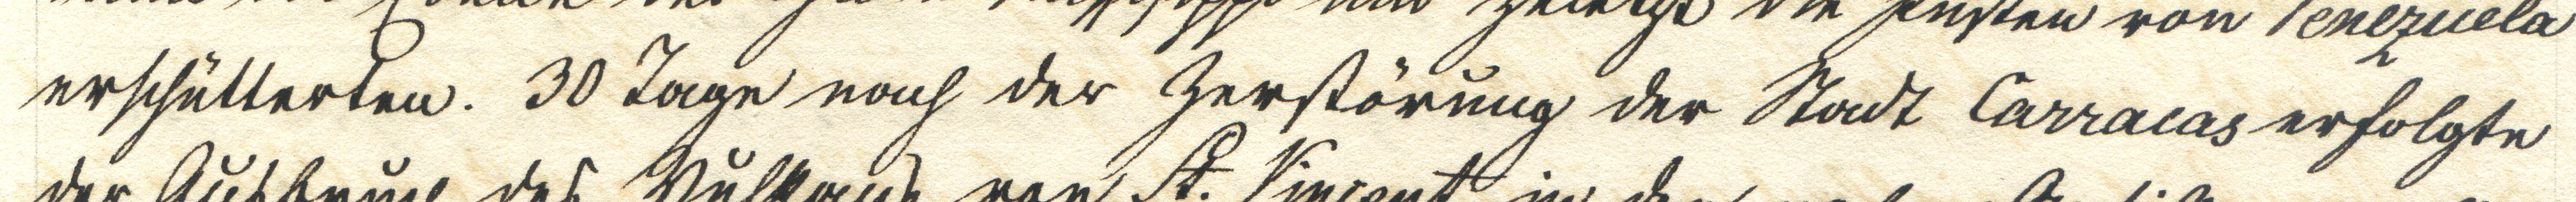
erschütterten. 30 Tage nach der Zerstörung der Stadt Carracas erfolgte
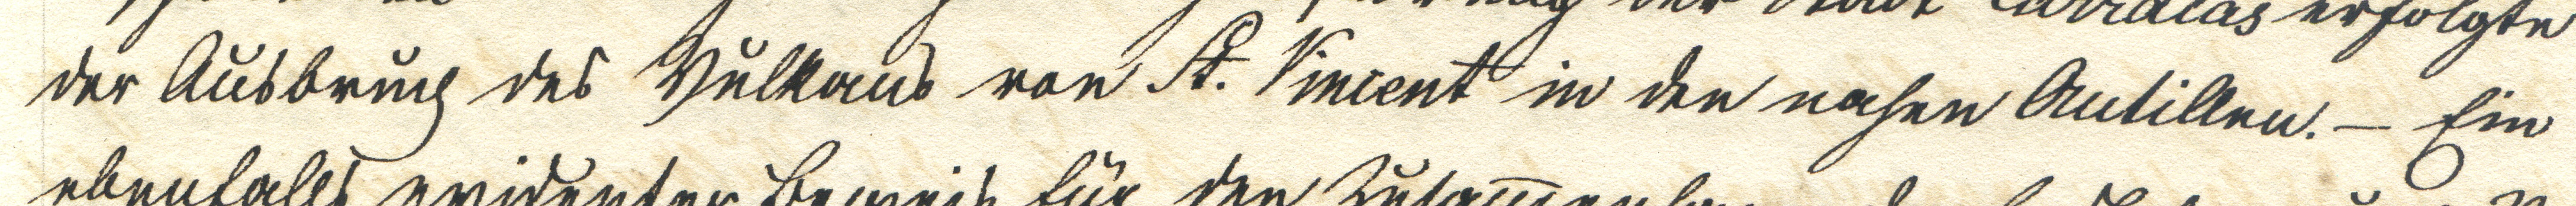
der Ausbruch des Vulkans von St. Vincent in den nahen Antillen. – Ein
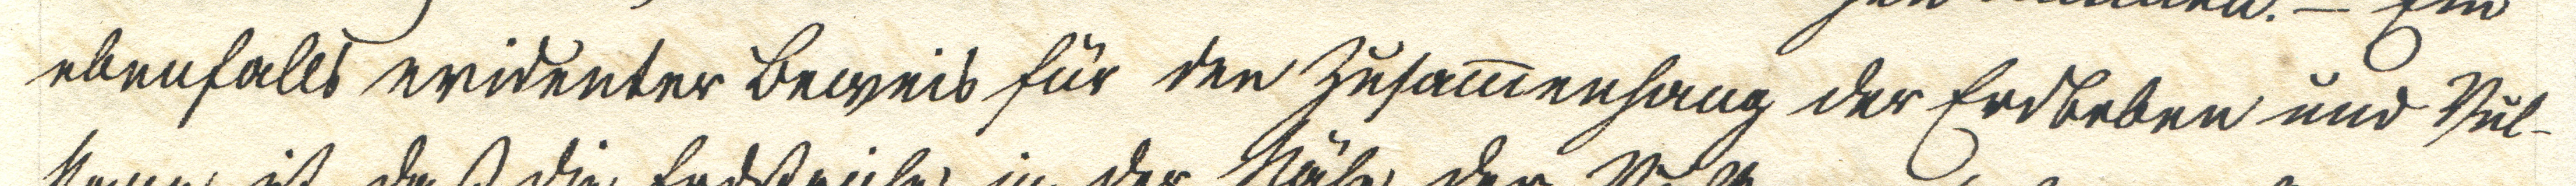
ebenfalls evidenter Beweis für den Zusam̃enhang der Erdbeben und Vul-
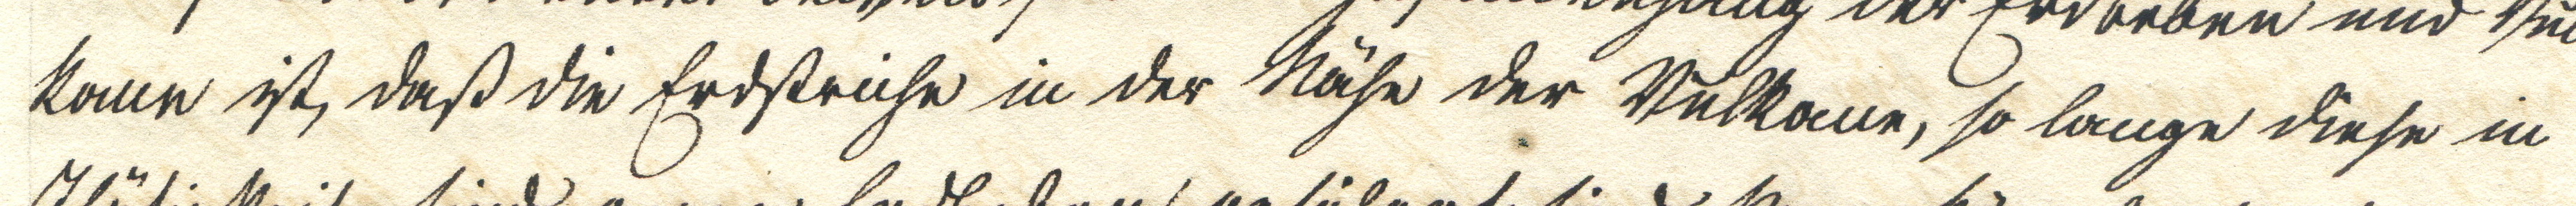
kane ist, daß die Erdstriche in der Nähe der Vulkane, so lange diese in
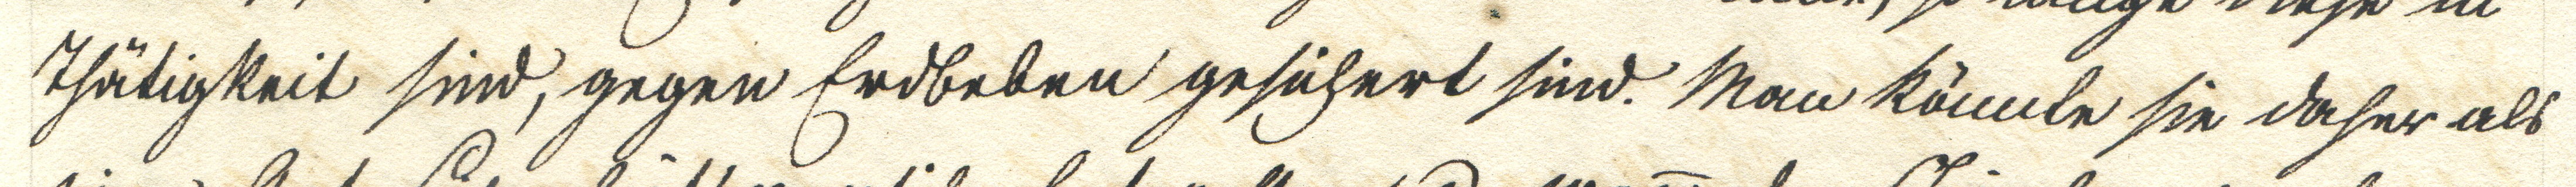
Thätigkeit sind, gegen Erdbeben gesichert sind. Man könnte sie daher als
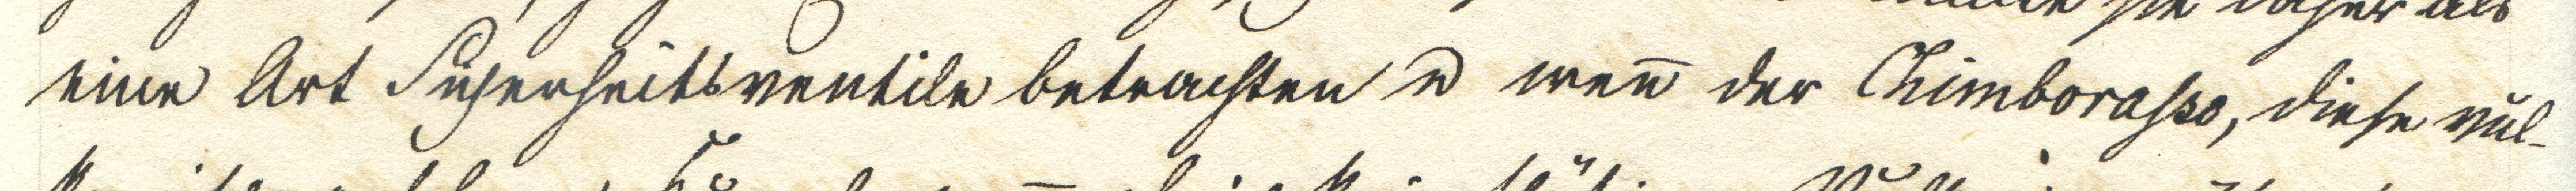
eine Art Sicherheitsventile betrachten u weñ der Chimborasso, diese vul-
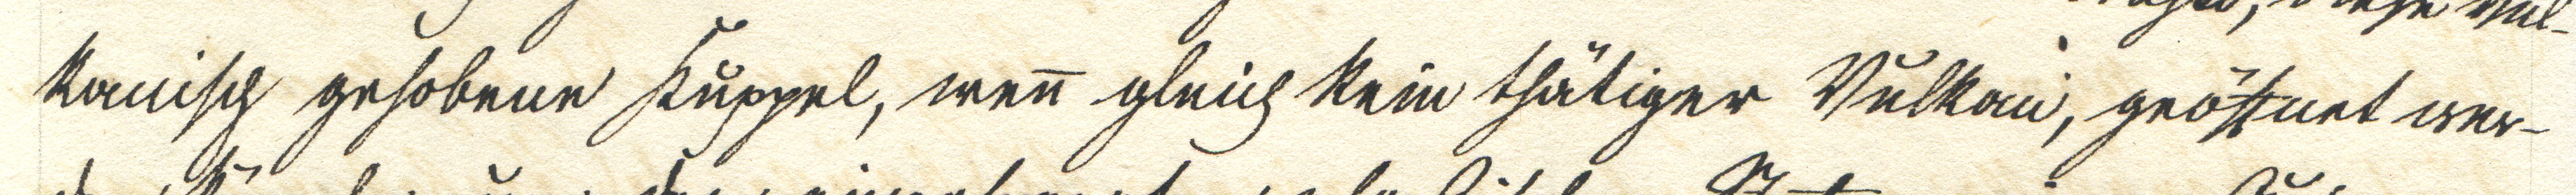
kanisch gehobene Kuppel, weñ gleich kein thätiger Vulkan, geöffnet wer-
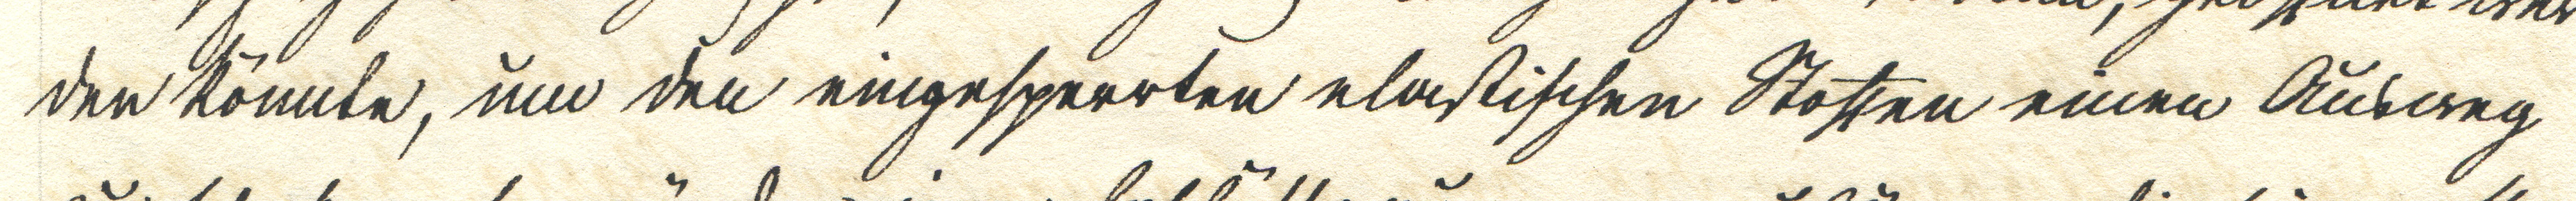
den könnte, um den eingesperrten elastischen Stoffen einen Ausweg
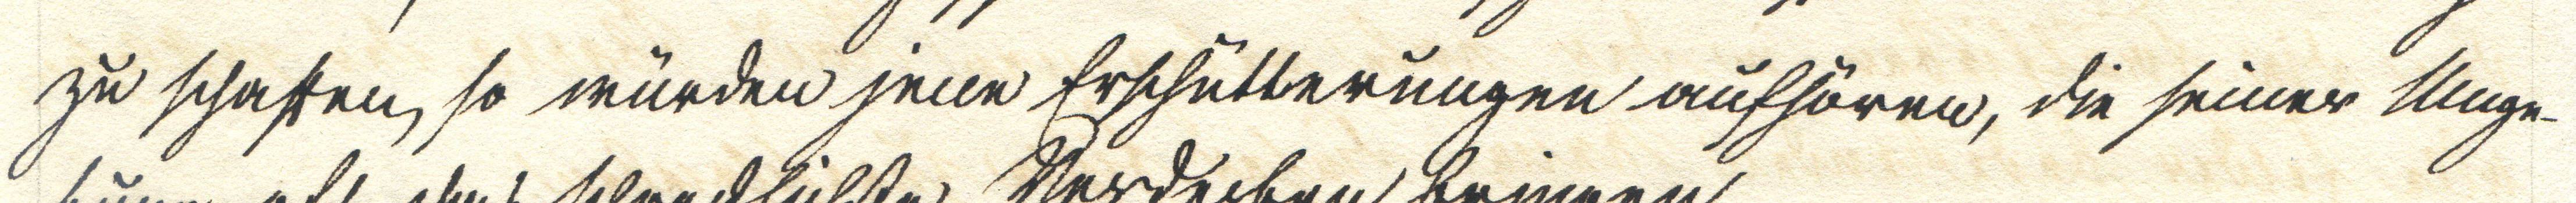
zu schaffen, so würden jene Erschütterungen aufhören, die seiner Umge-
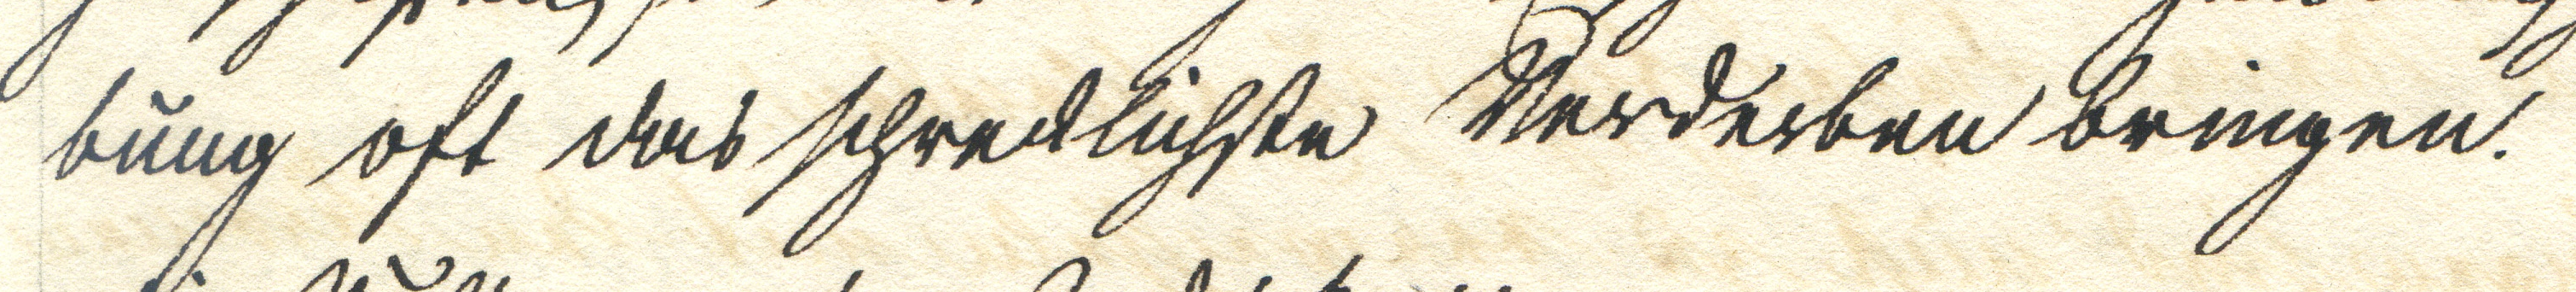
bung oft das schrecklichste Verderben bringen.
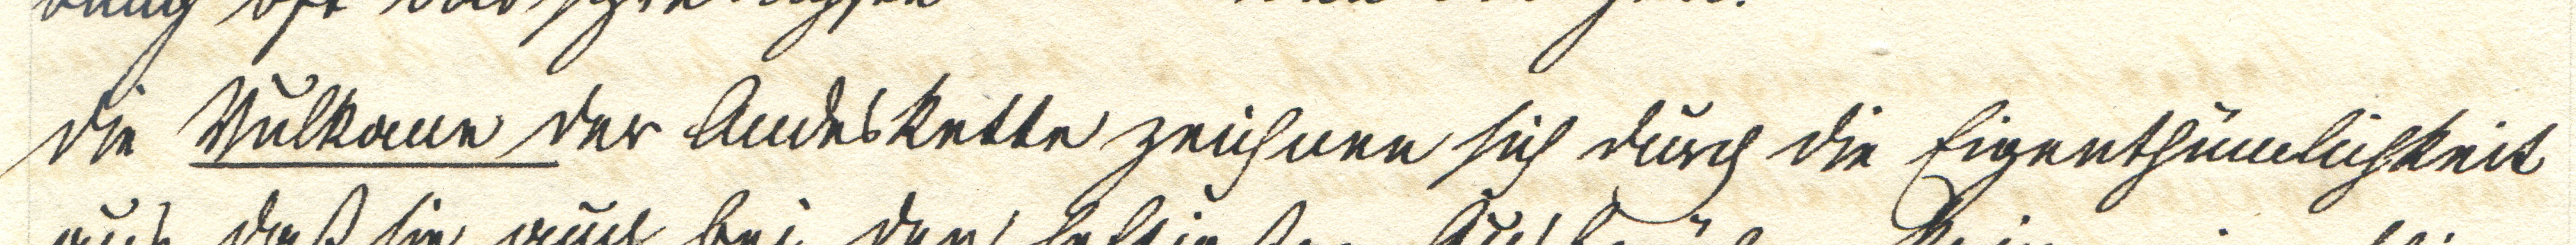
Die Vulkane der Andeskette zeichnen sich durch die Eigenthümlichkeit
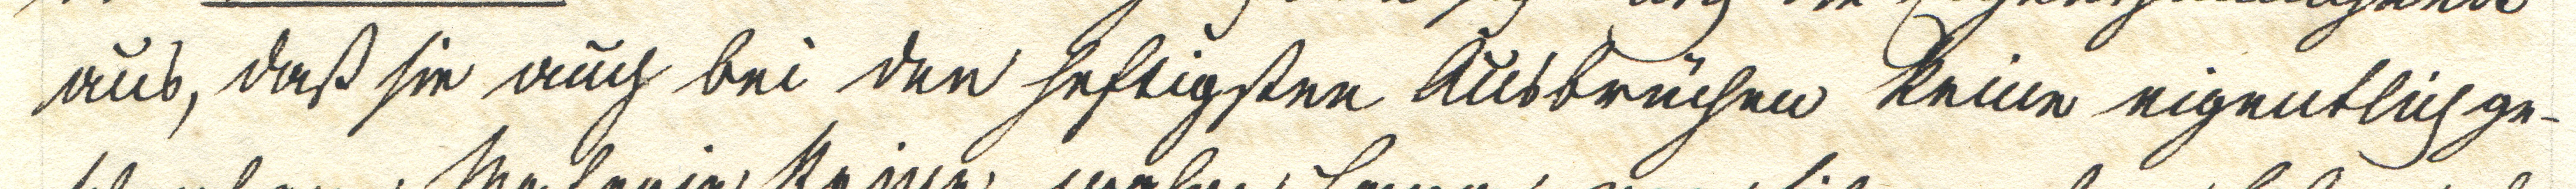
aus, daß sie auch bei den heftigsten Ausbrüchen keine eigentlich ge-
